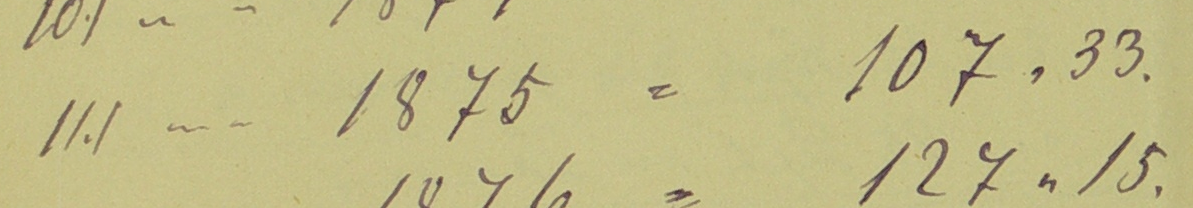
11.) * 1875 = 107 * 33 *
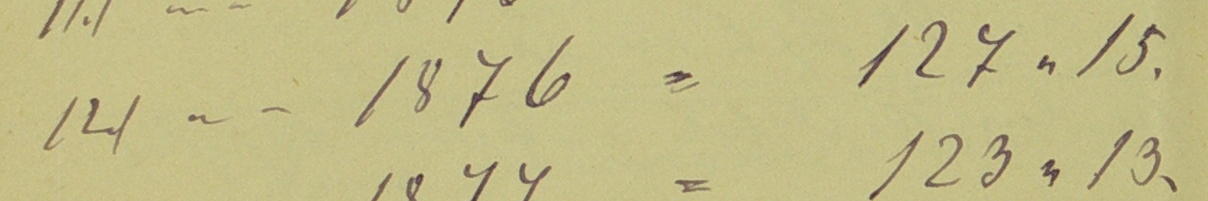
12.) * 1876 = 127 * 15 *
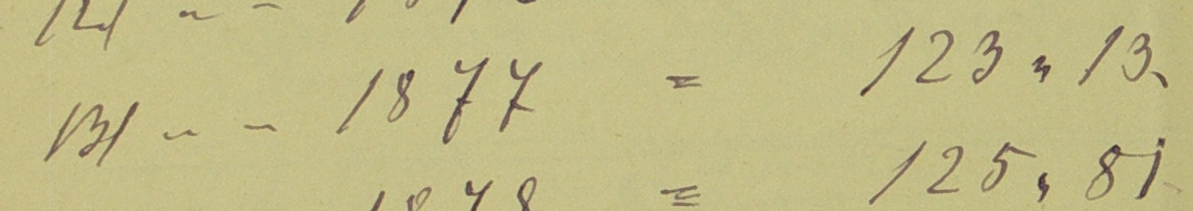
13.) * 1877 = 123 * 13 *
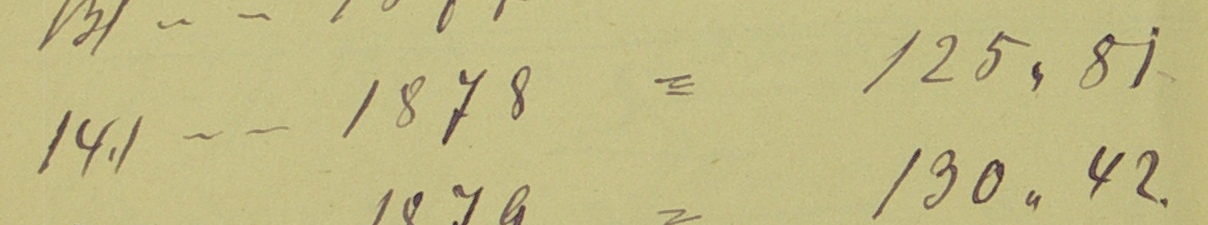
14.) * 1878 = 125 * 81 *
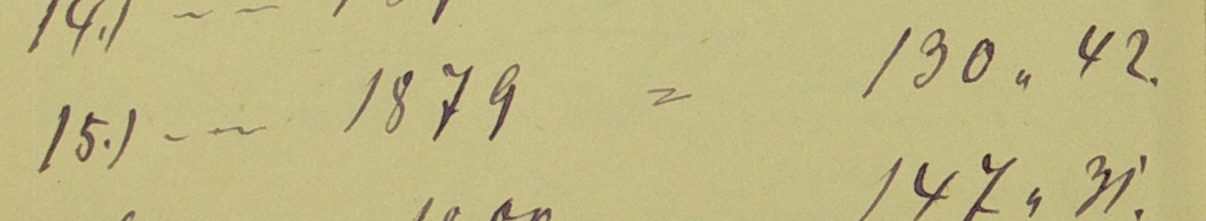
15.) * 1879 = 130 * 42 *
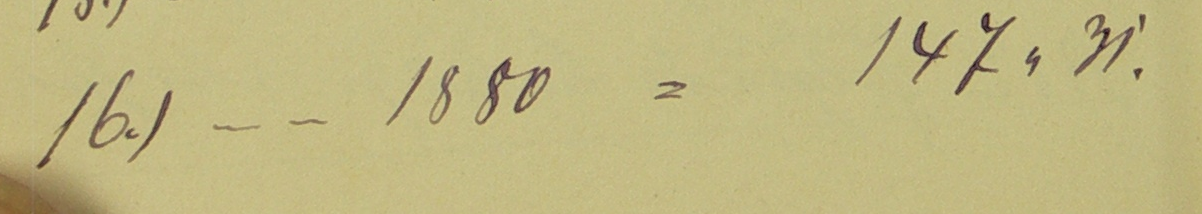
16.) * 1880 = 147 * 31 *
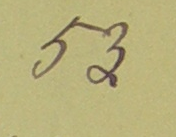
53
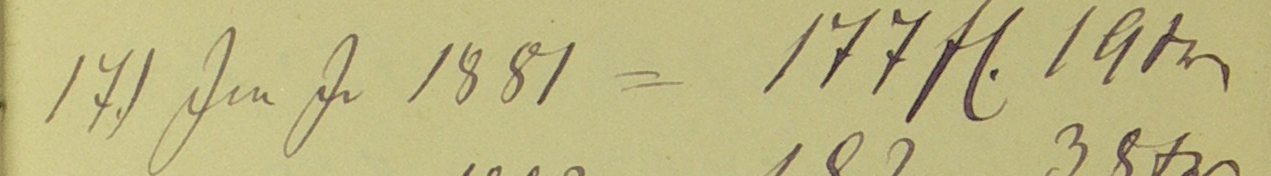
17.) Im J. 1881 = 177 * 19 *
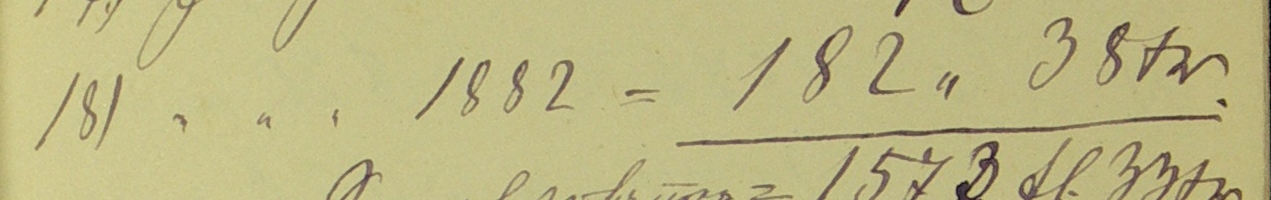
18.) * 1882 = 182 * 38 *
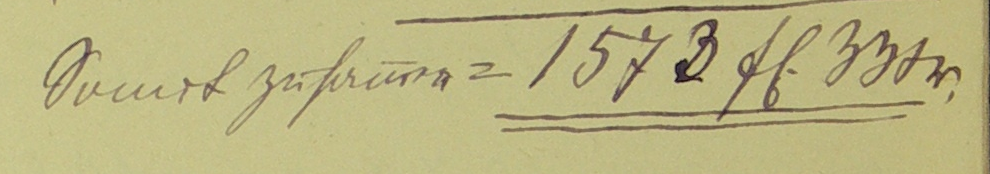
Somit zusammen = 1573 Fl. 33 Tr.
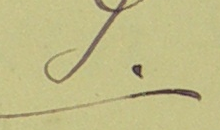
S
